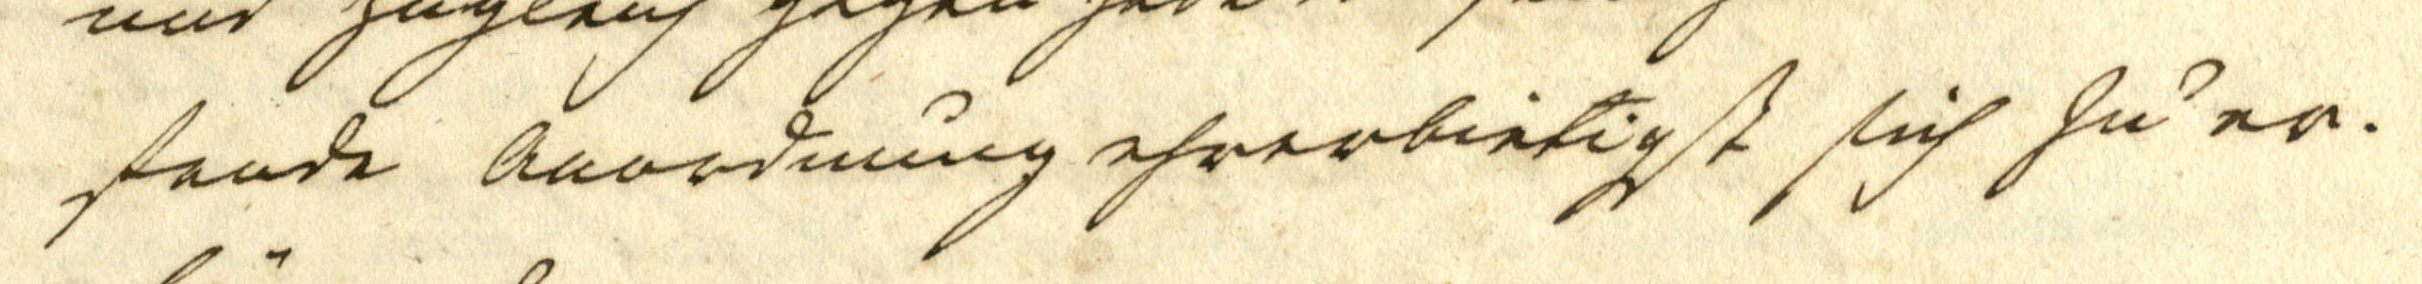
fende Anordnung ehrerbietigst sich zu er¬
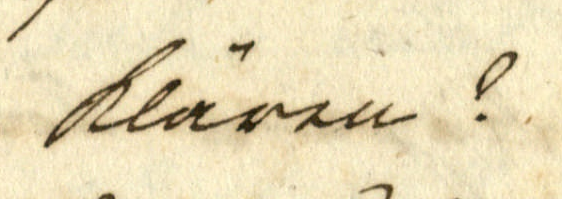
klären?
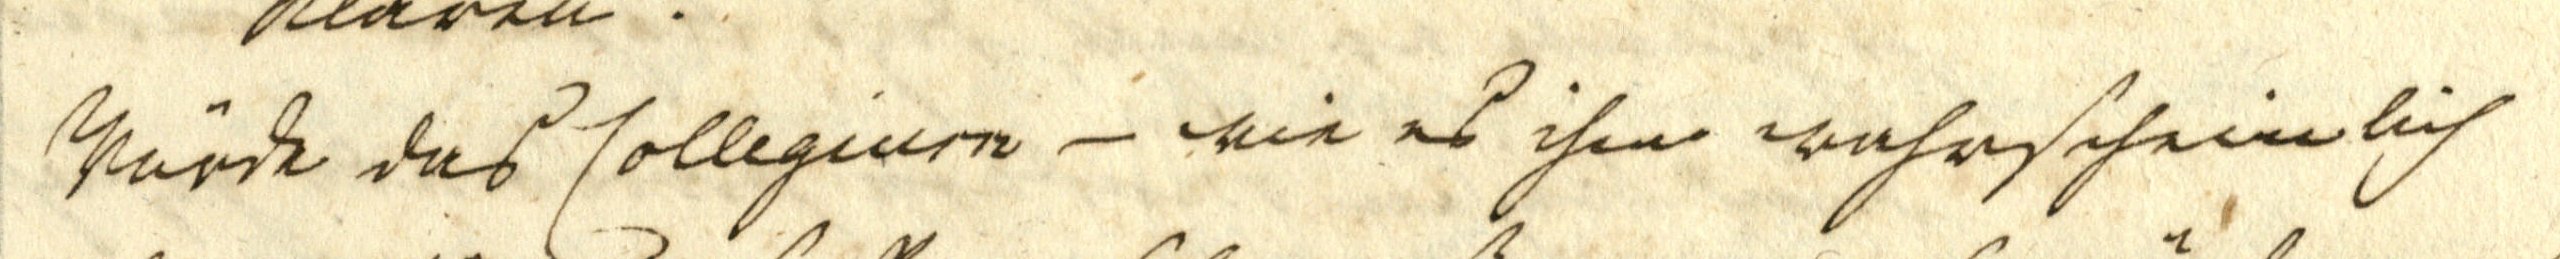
Würde das Collegium - wie es ihm wahrscheinlich
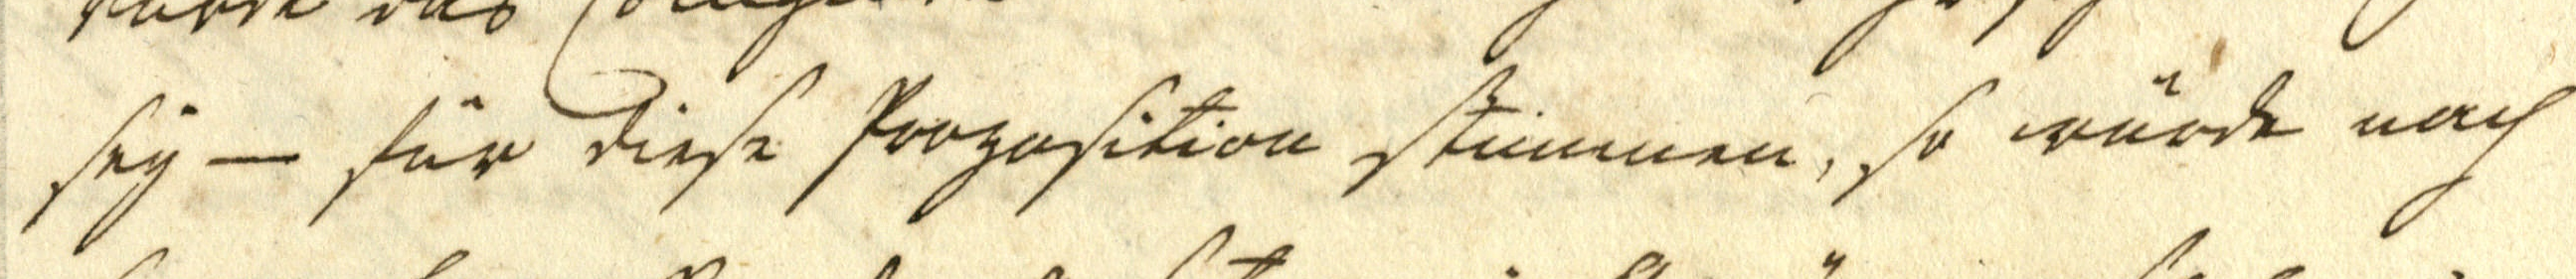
seÿ - für diese Proposition stimmen, so würde nach
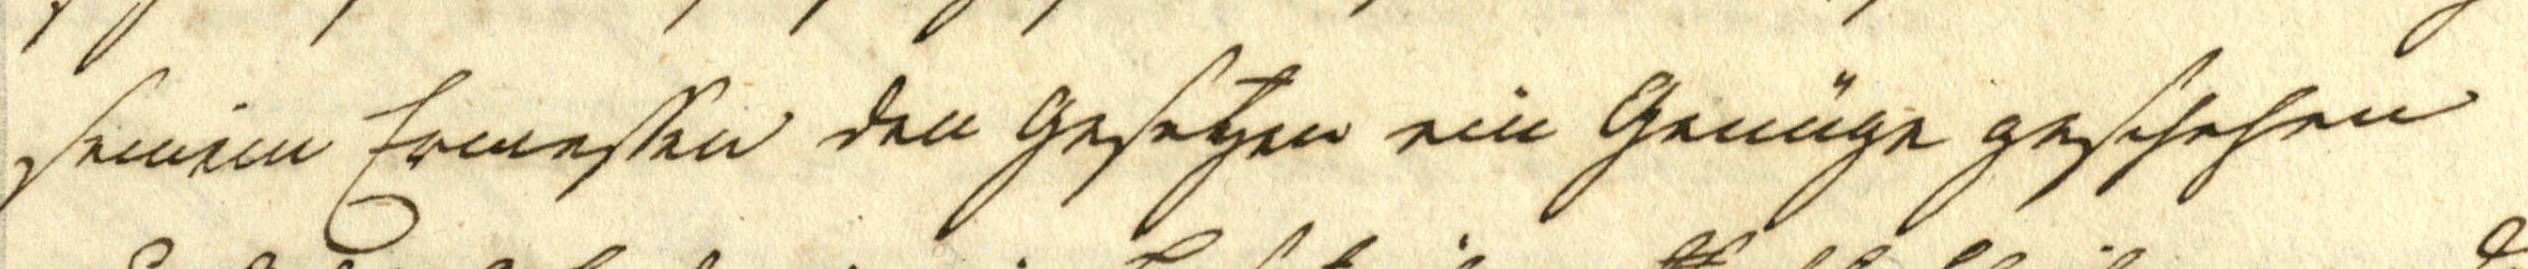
seinem Ermessen den Gesetzen ein Genüge geschehen
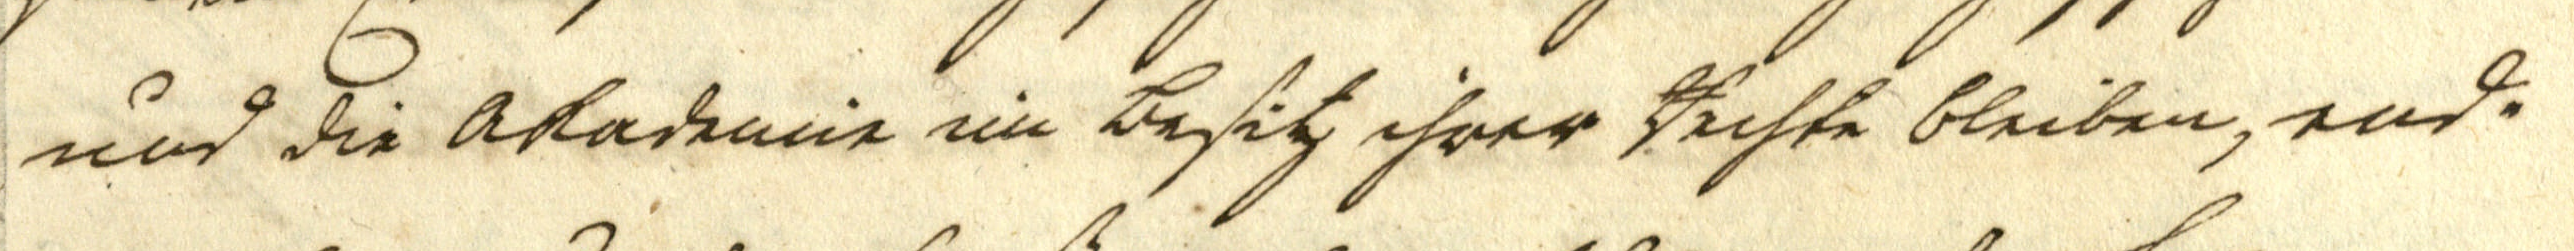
und die Akademie im Besitz ihrer Rechte bleiben, end¬
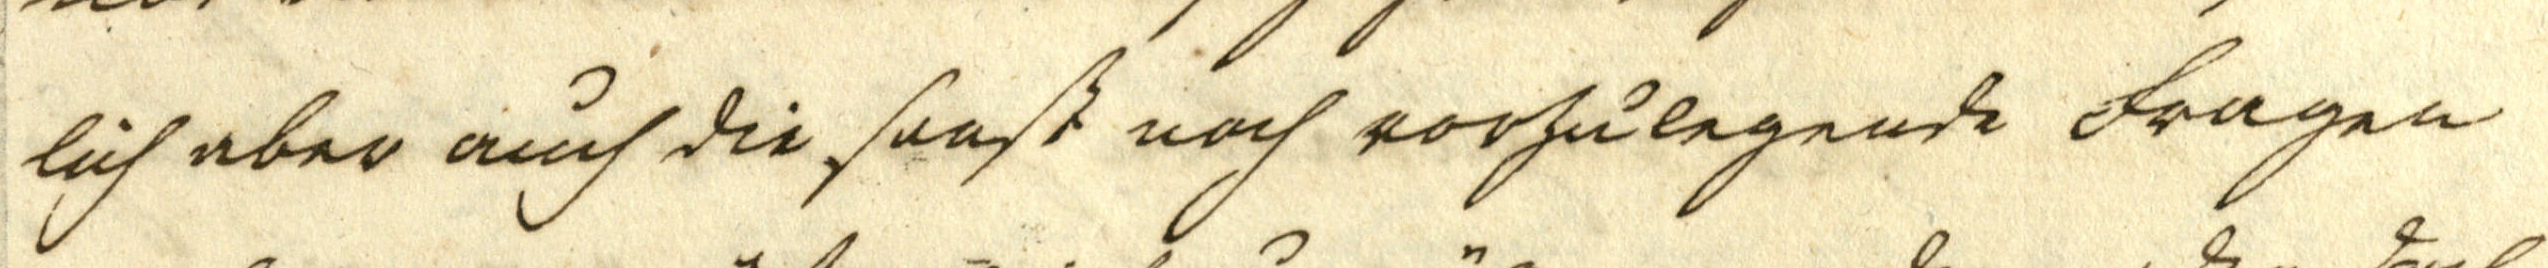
lich aber auch die sonst noch vorzulegende Fragen
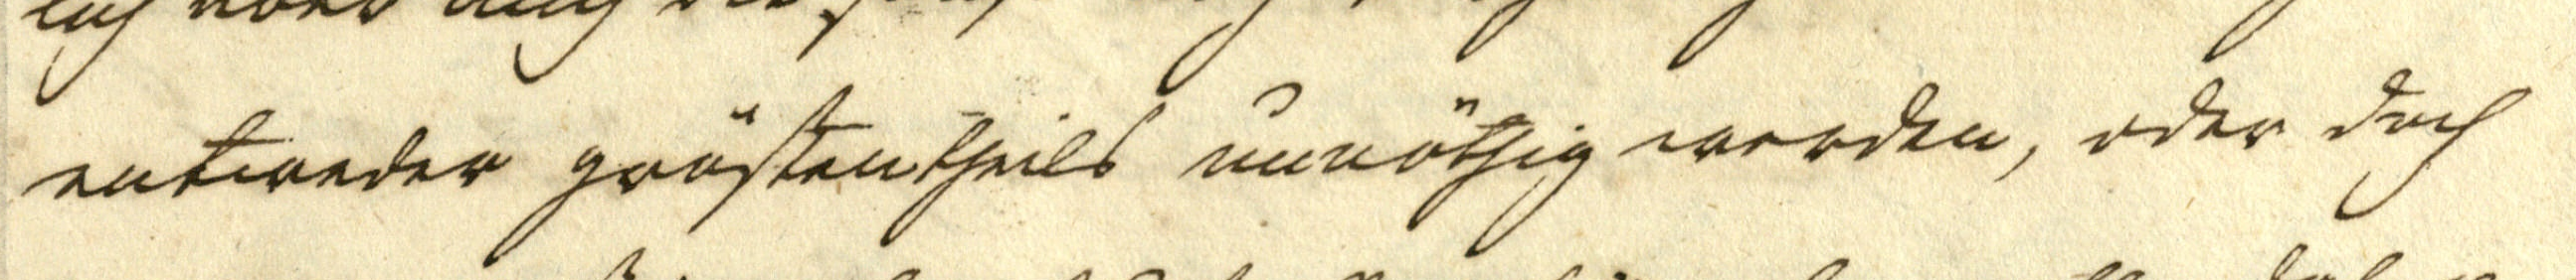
entweder größtentheils unnöthig werden, oder doch
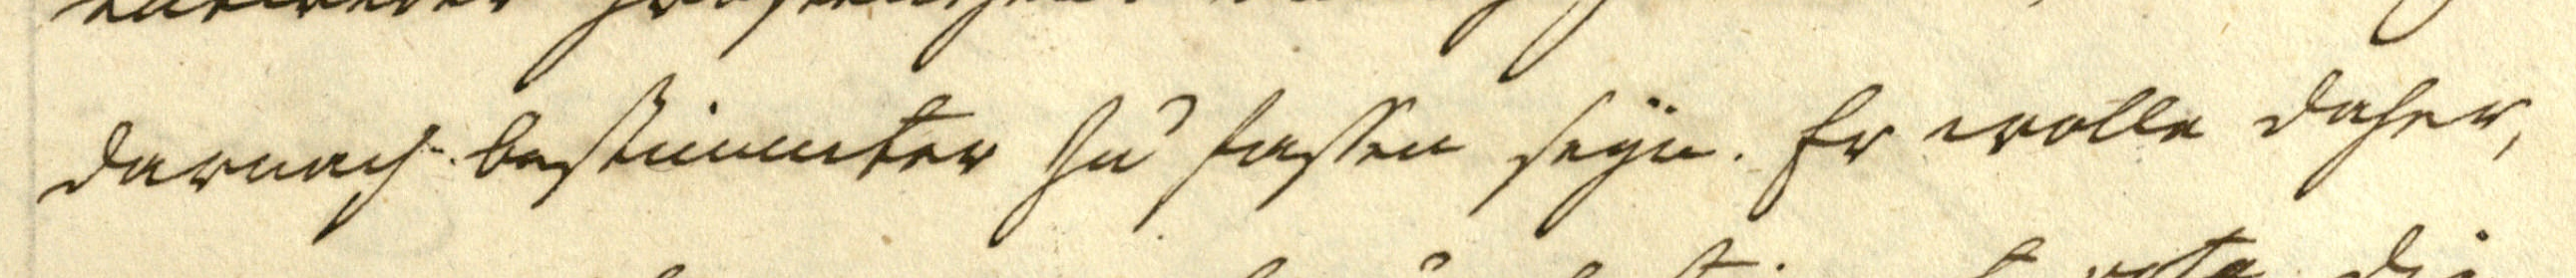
darnach bestimmter zu fassen seÿn. Er wolle daher,
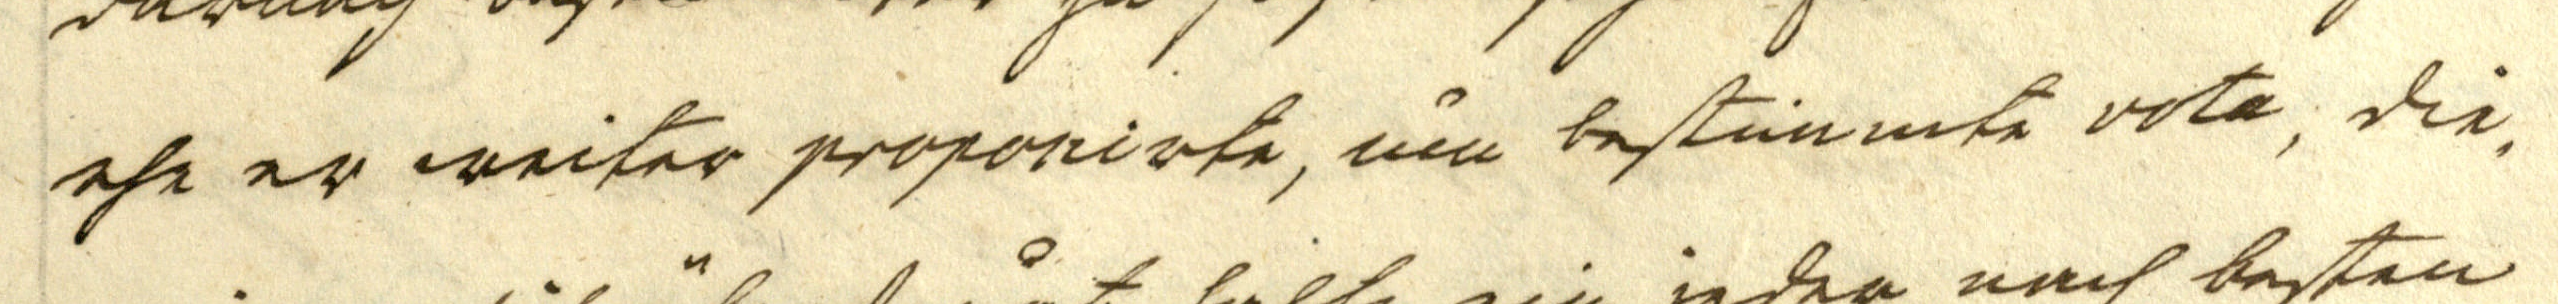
ehe er weiter proponirte, um bestimmte vota, die
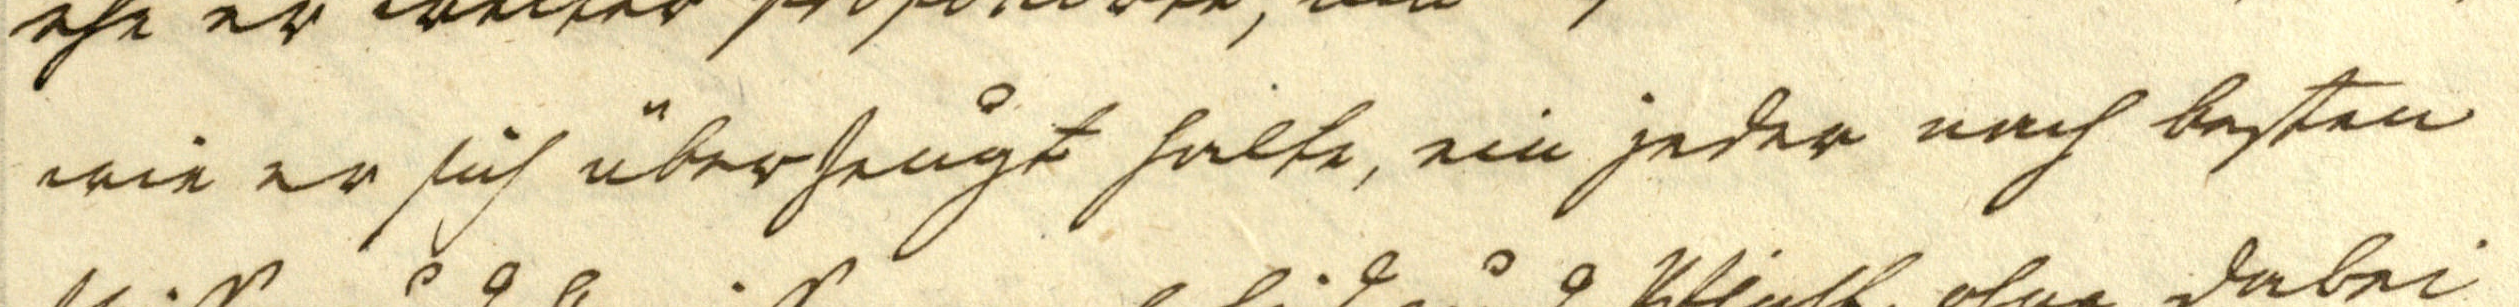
wie er sich überzeugt halte, ein jeder nach besten
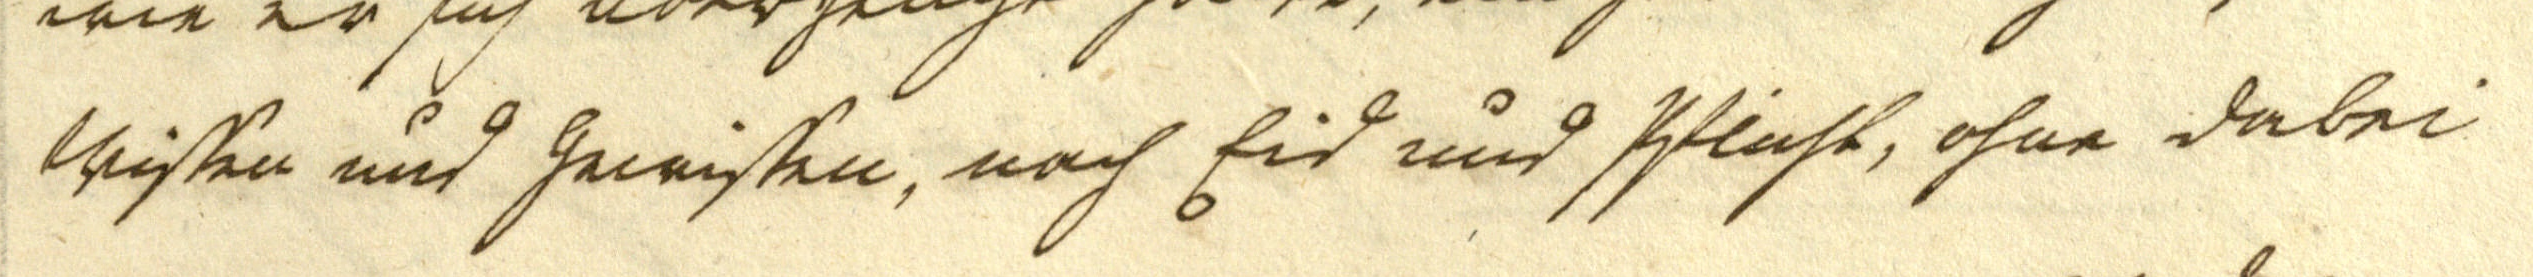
Wissen und Gewissen, nach Eid und Pflicht, ohne dabei
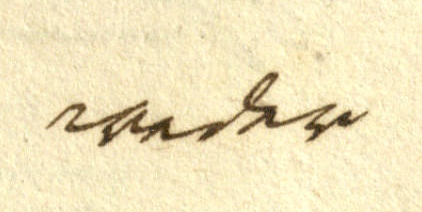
weder
